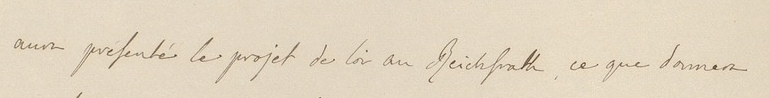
aura présenté le projet de loi au Reichsrath, ce que donnera
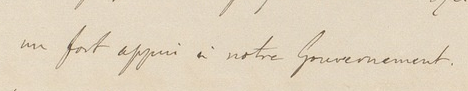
un fort appui à notre Gouvernement.
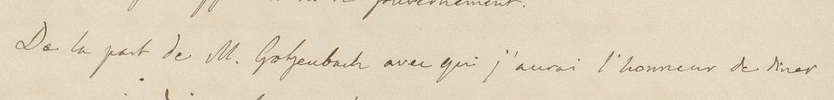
De la part de M. Gotzenbach avec qui j'aurai l'honneur de dîner
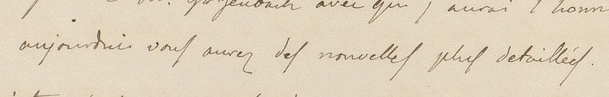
aujourd'ui vous aurez des nouvelles plus detaillées.
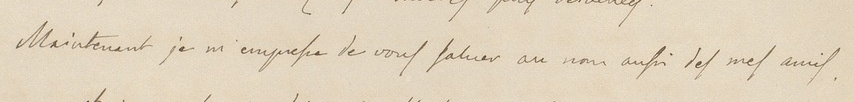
Maintenant je m`empresse de vous saluer au nom aussi des mes amis,
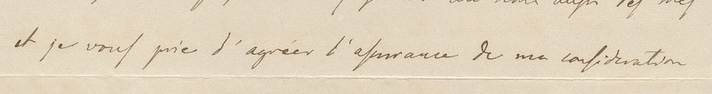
et je vous prie d`agréer l'assurance de ma consideration
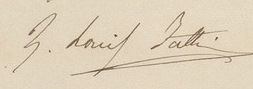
Ig. Louis Tatti
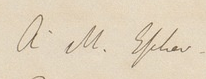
À M. Escher.
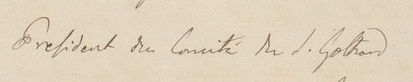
President du Comité de S. Gothard
